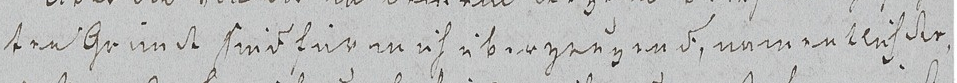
ten Gründe sind für mich überzeugend; namentlich der,
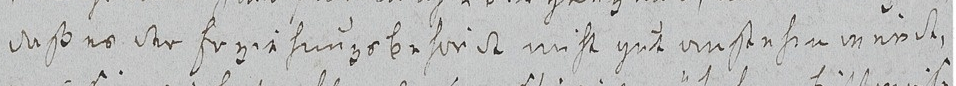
daß es der Erziehungsbehörde nicht gut anstehen würde,
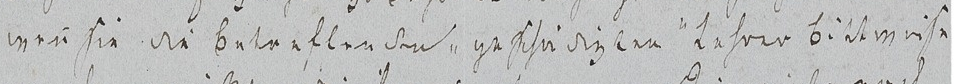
wenn sie die betreffenden «geschädigten» Lehrer bittweise
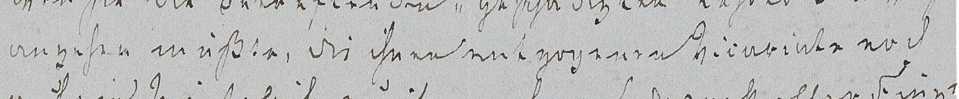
angehen müßte, die ihnen entzogenen Vicariate noch
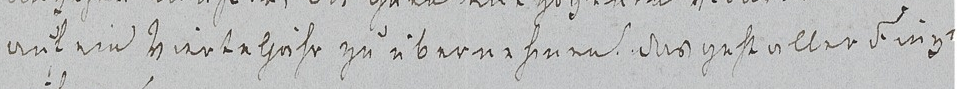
auf ein Vierteljahr zu übernehmen. Das geht allerdings
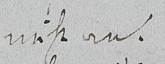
nicht an.
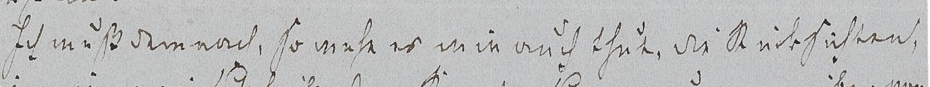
Ich muß demnach, so wehe es mir auch thut, die Rücksichten,
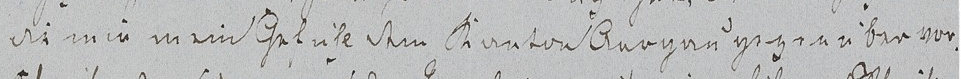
die mir mein Gefühl dem Kanton Aargau gegenüber vor-
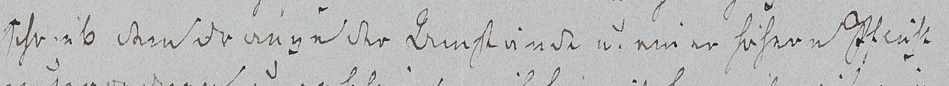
schrieb dem Drange der Umstände u. einer höhern Pflicht
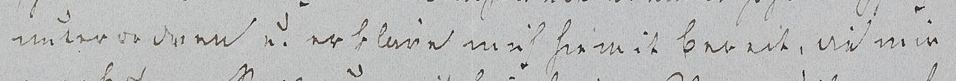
unterordnen u. erkläre mich hiemit bereit, die mir
